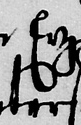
t.
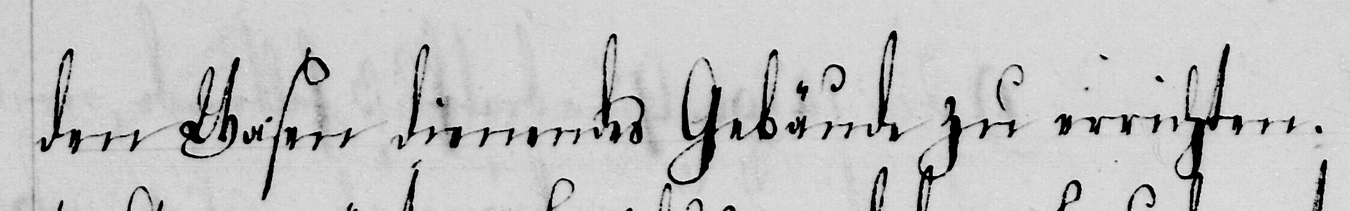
den Wasen dienendes Gebäude zu errichten.
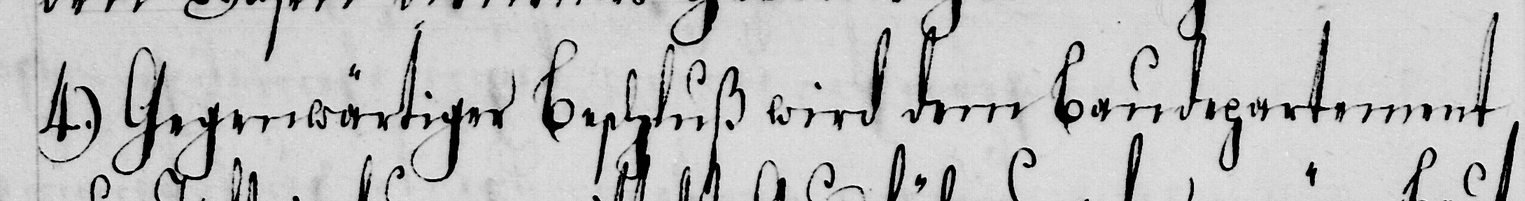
4.) Gegenwärtiger Beschluß wird dem Baudepartement
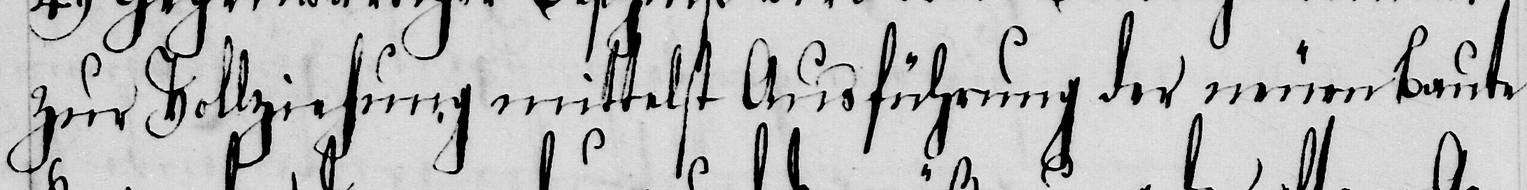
zur Vollziehung mittelst Ausführung der neuen Baute
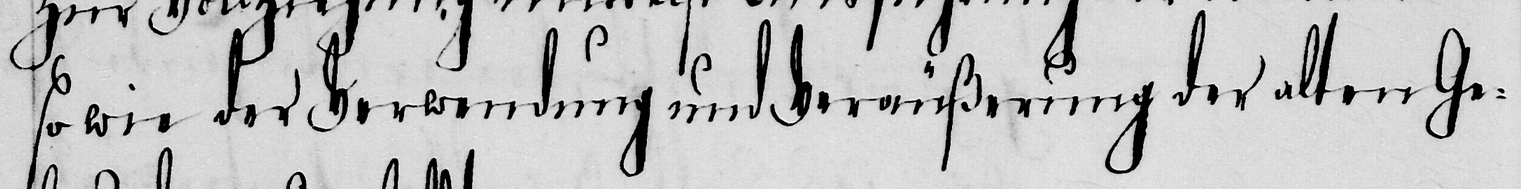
sowie der Verwendung und Veräußerung der alten Ge¬
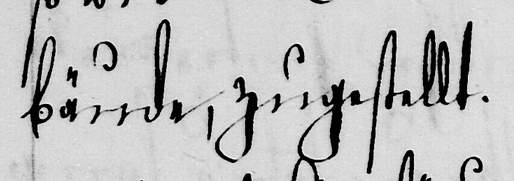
bäude, zugestell¬
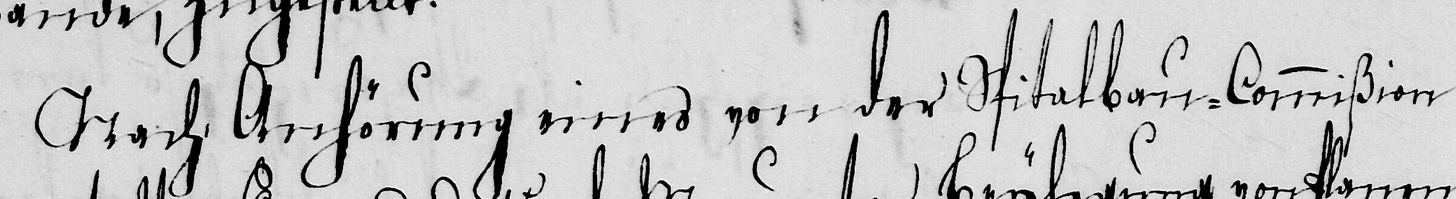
Nach Anhörung eines von der Spitalbau-Commißion
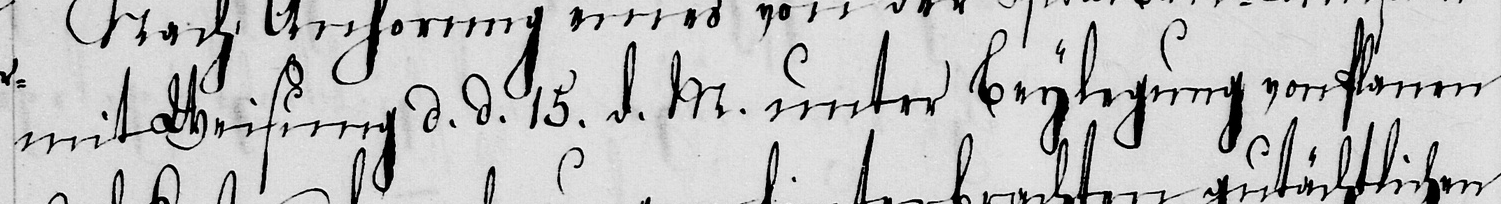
mit Weisung d. d. 15. d. M. unter Beylegung von Planen
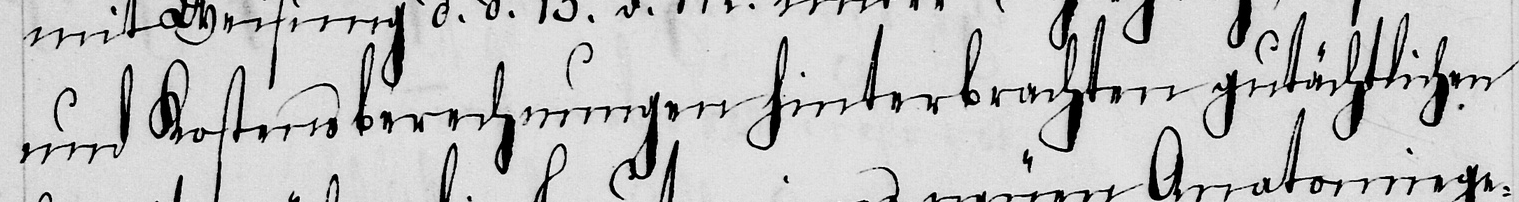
und Kostenberechnungen hinterbrachten gutächtlichen
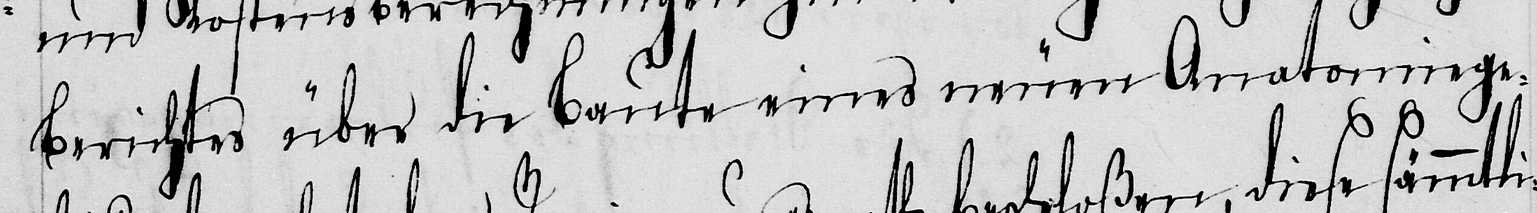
Berichtes über die Baute eines neuen Anatomiege¬
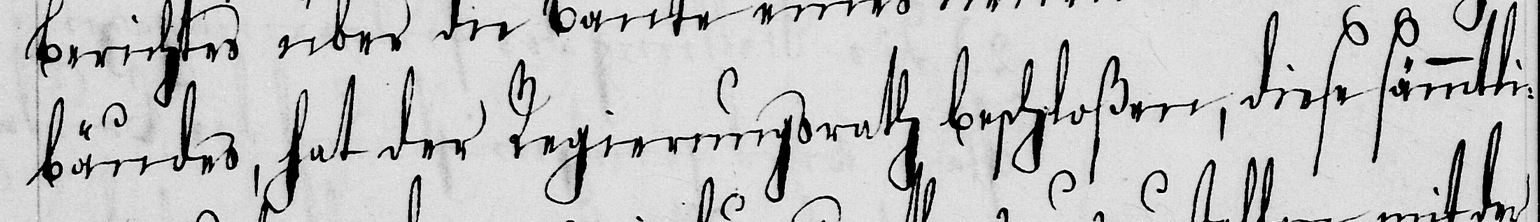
bäudes, hat der Regierungsrath beschloßen, diese sämmt¬
